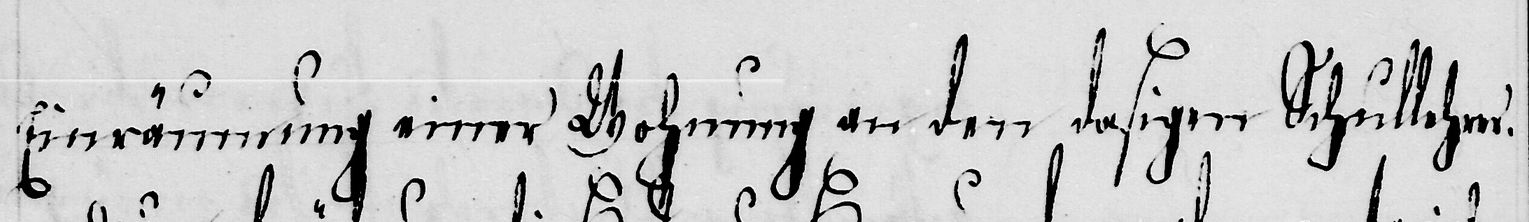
Einräumung einer Wohnung an den dasigen Schullehre¬
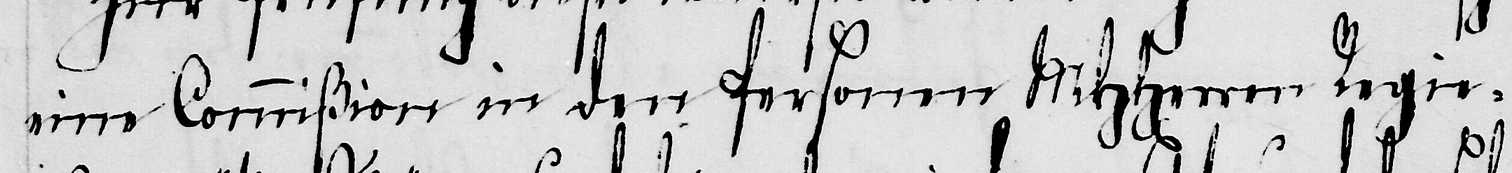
eine Commißion in den Personen MHHerren Regie¬
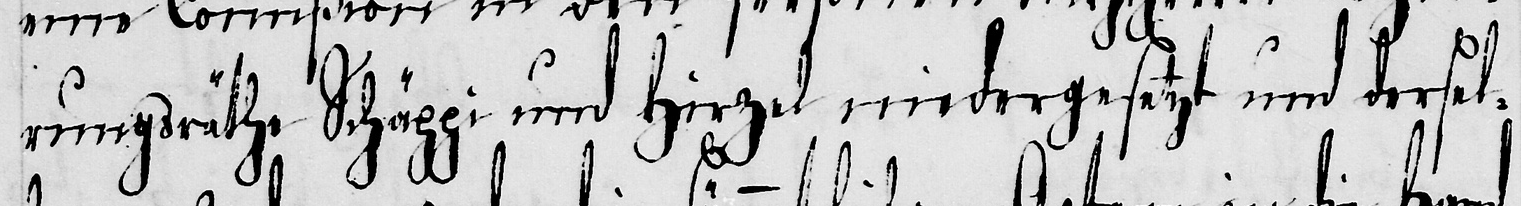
rungsräthe Schäppi und Hirzel niedergesetzt und dersel¬
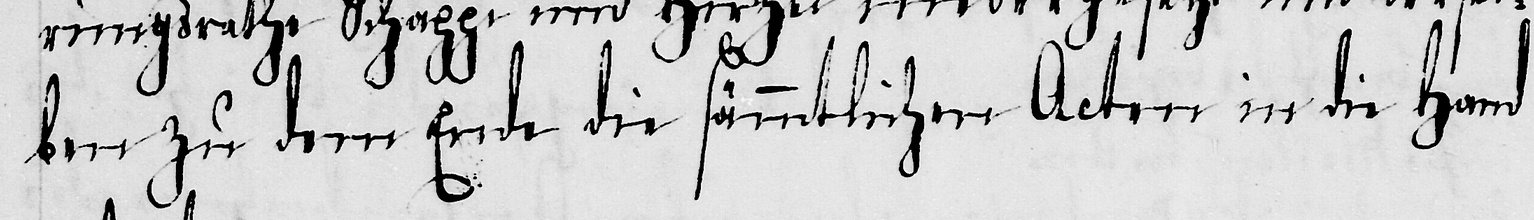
ben zu dem Ende die sämmtlichen Acten in die Hand
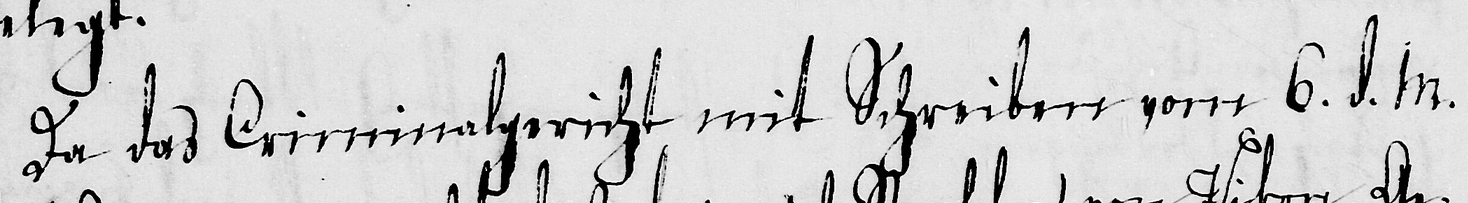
Da das Criminalgericht mit Schreiben vom 6. d. M.
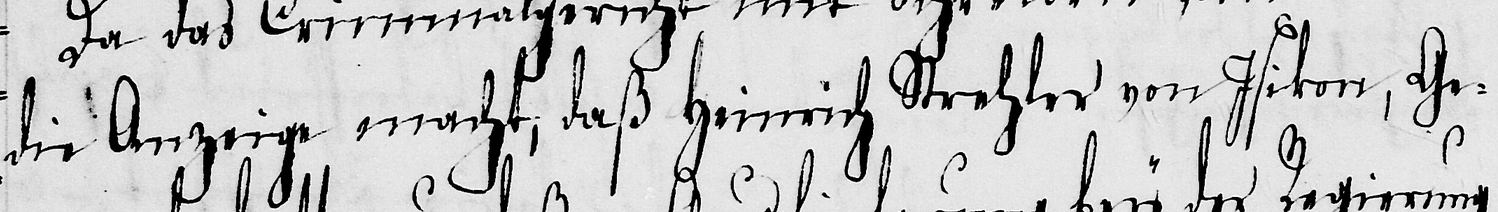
die Anzeige macht, daß Heinrich Strehler von Isikon, Ge¬
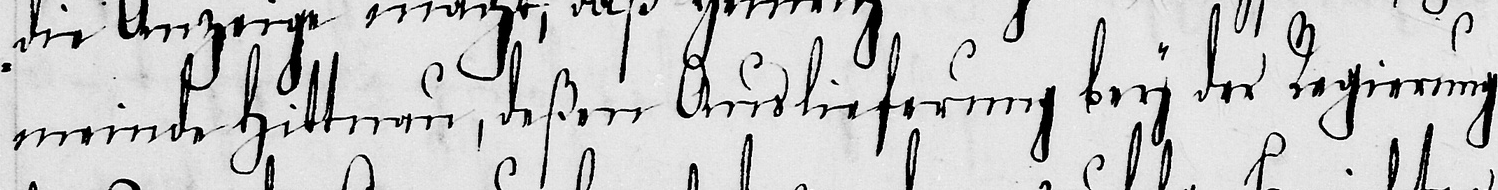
meinde Hittnau, deßen Auslieferung bey der Regierung
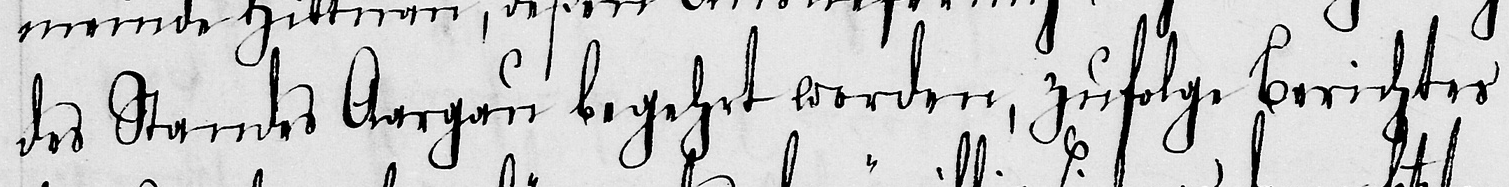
des Standes Aargau begehrt worden, zufolge Berichtes
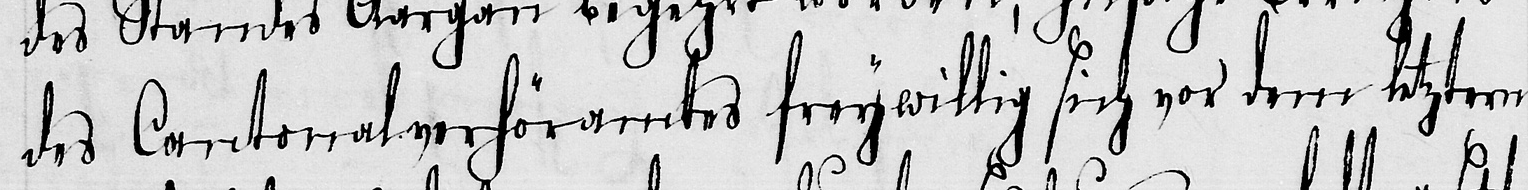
des Cantonalverhöramtes freywillig sich vor dem letztern
